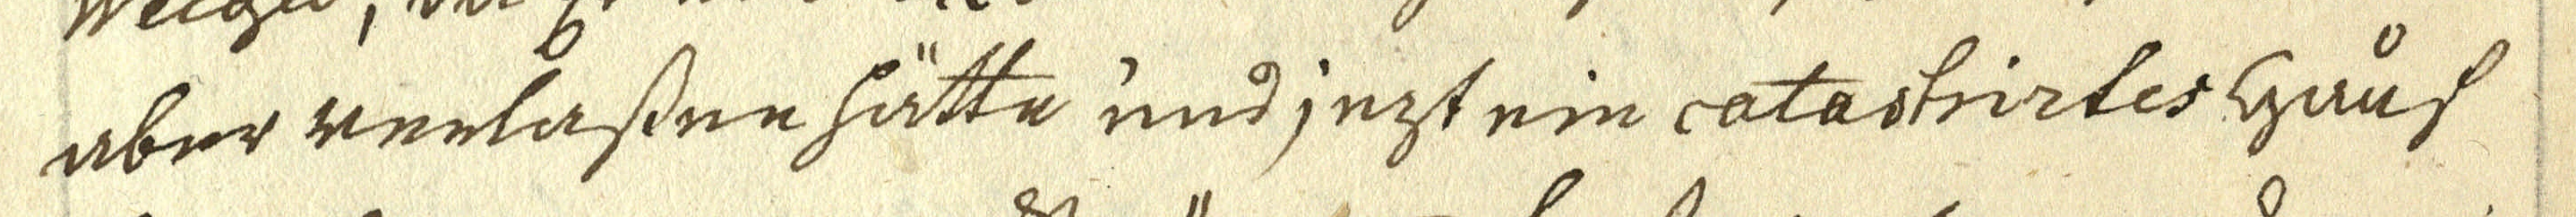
aber verlassen hätte und jezt ein catastrirtes Haus
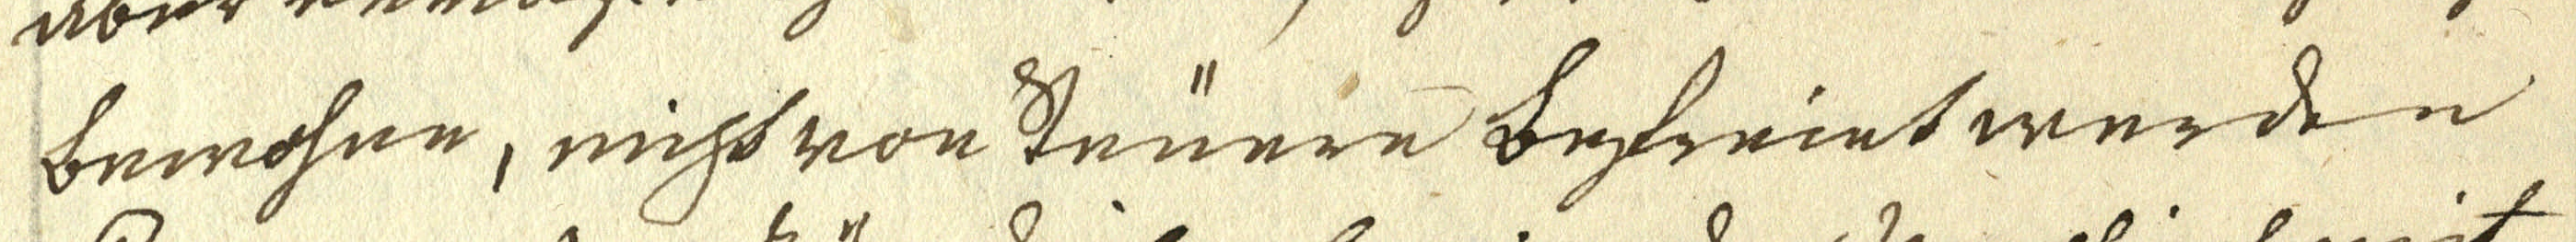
bewohne, nicht von Steuern befreiet werden
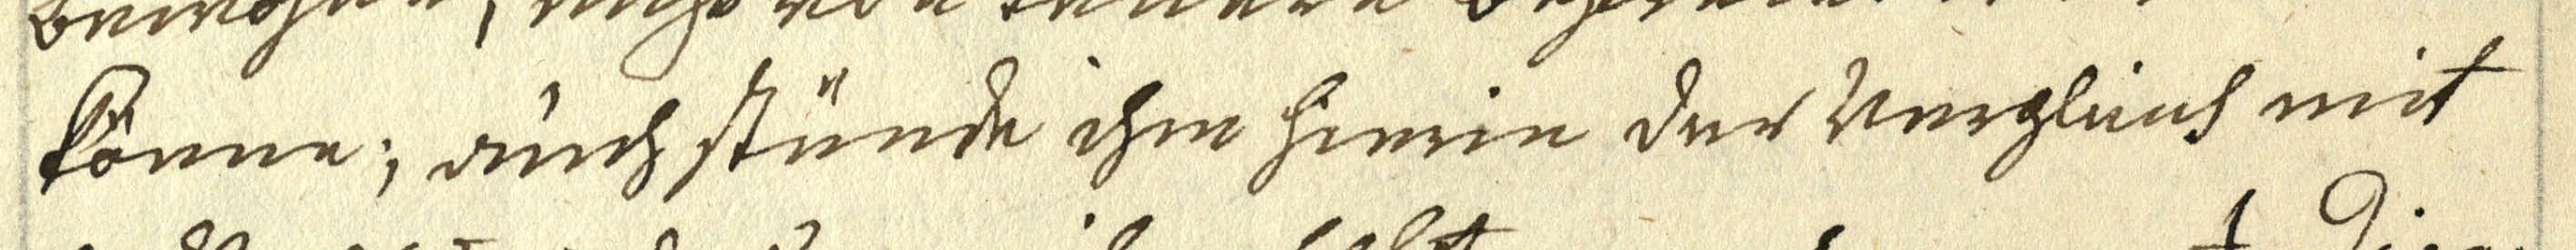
könne, auch stünde ihm hierin der Vergleich mit
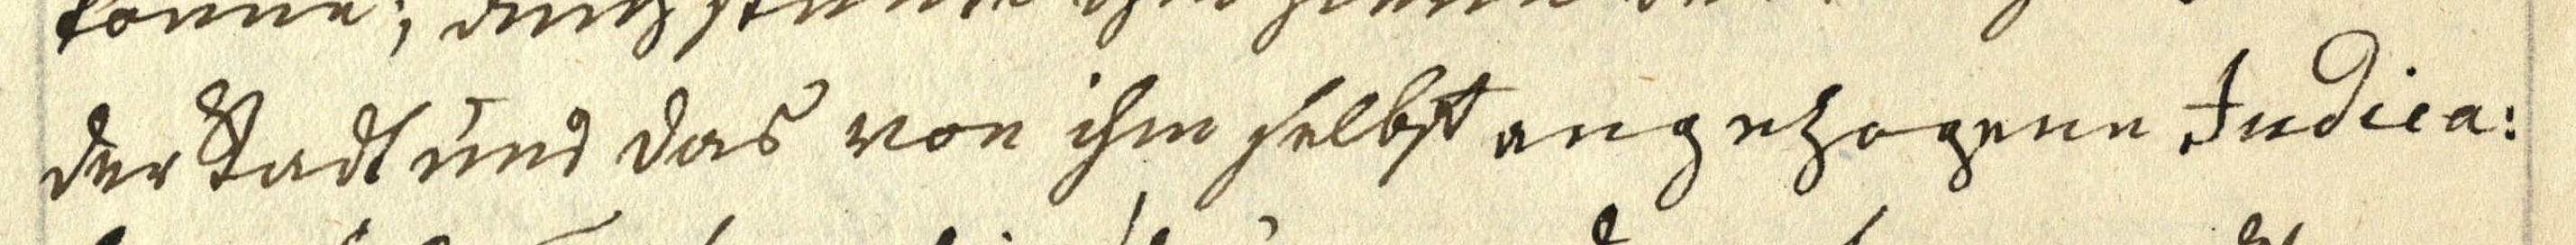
der Stadt und das von ihm selbst angezogene Judica¬
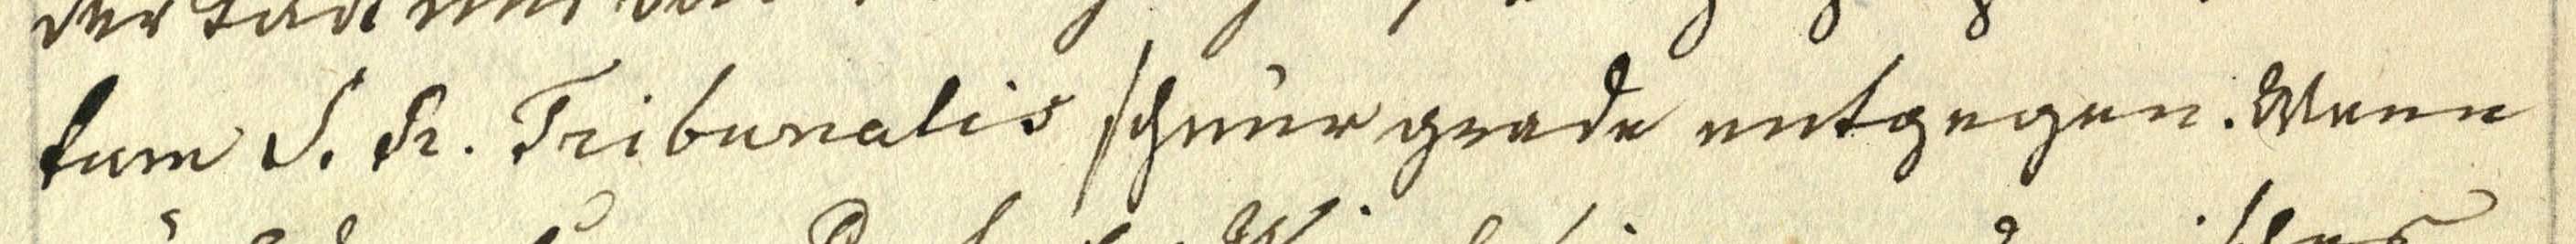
tum S. R. Tribunalis schnur grade entgegen. Wenn
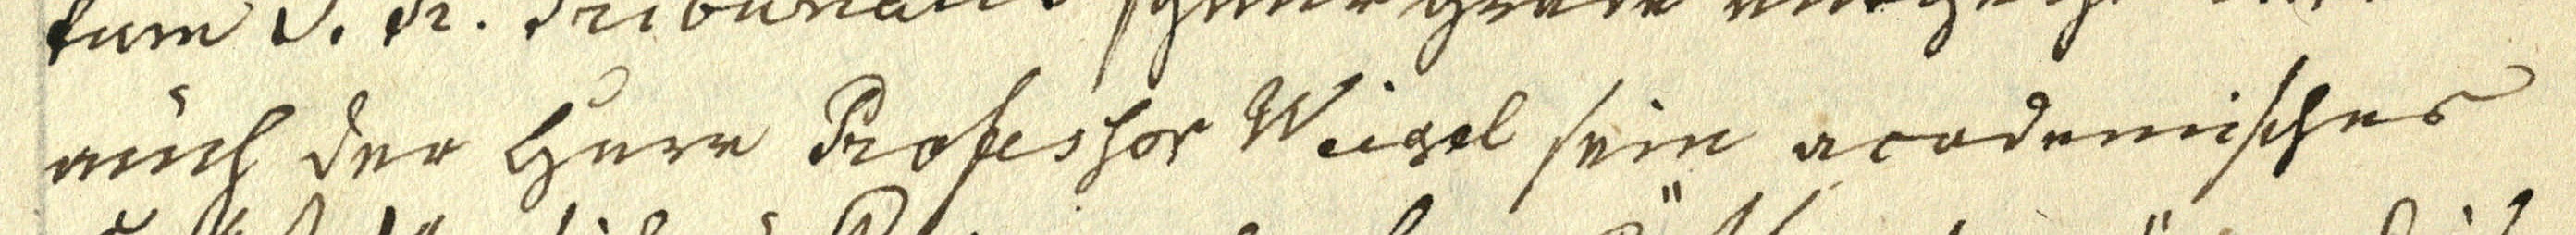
auch der Herr Professor Weigel sein academisches
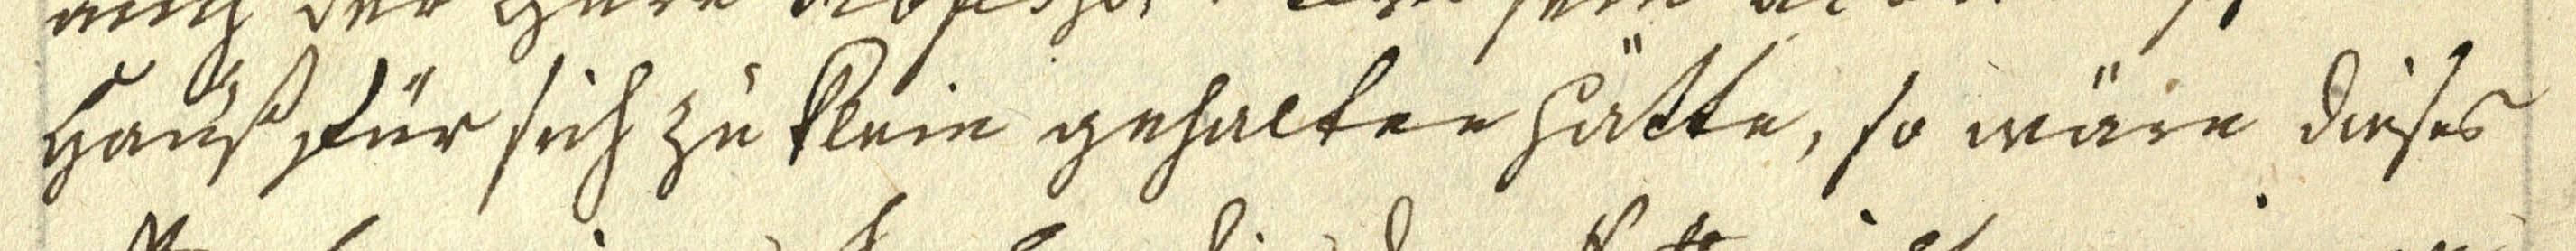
Hauß für sich zu klein gehalten hätte, so wäre dieses
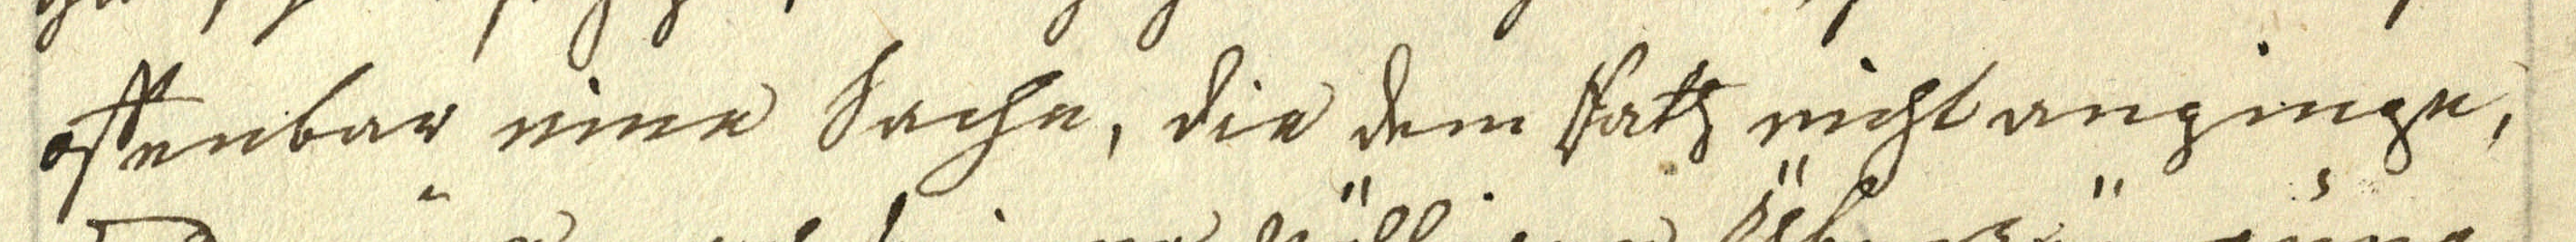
offenbar eine Sache, die dem Rath nicht anginge,
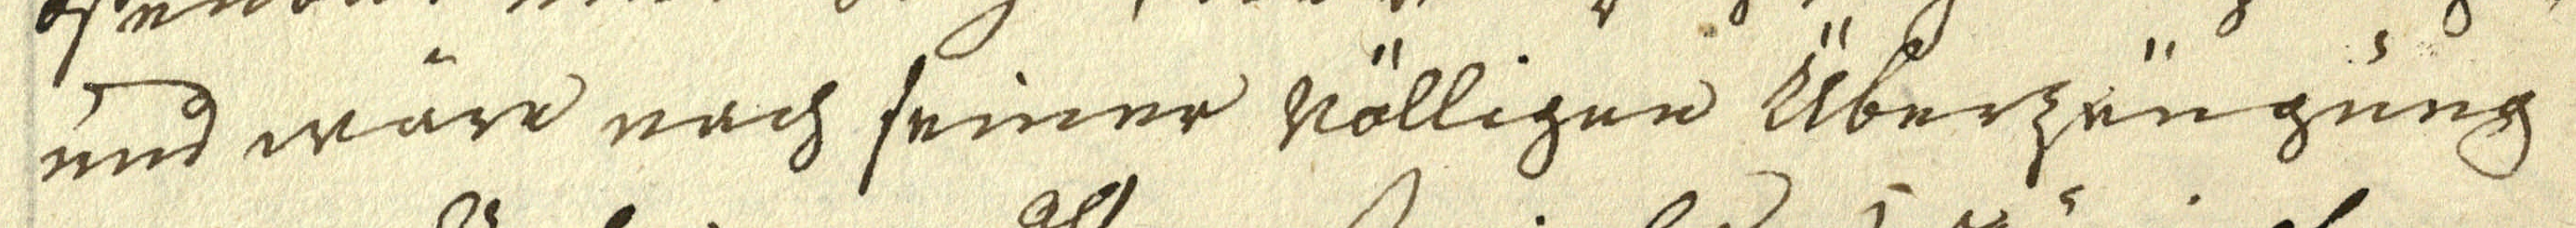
und wäre nach seiner völligen Überzeugung
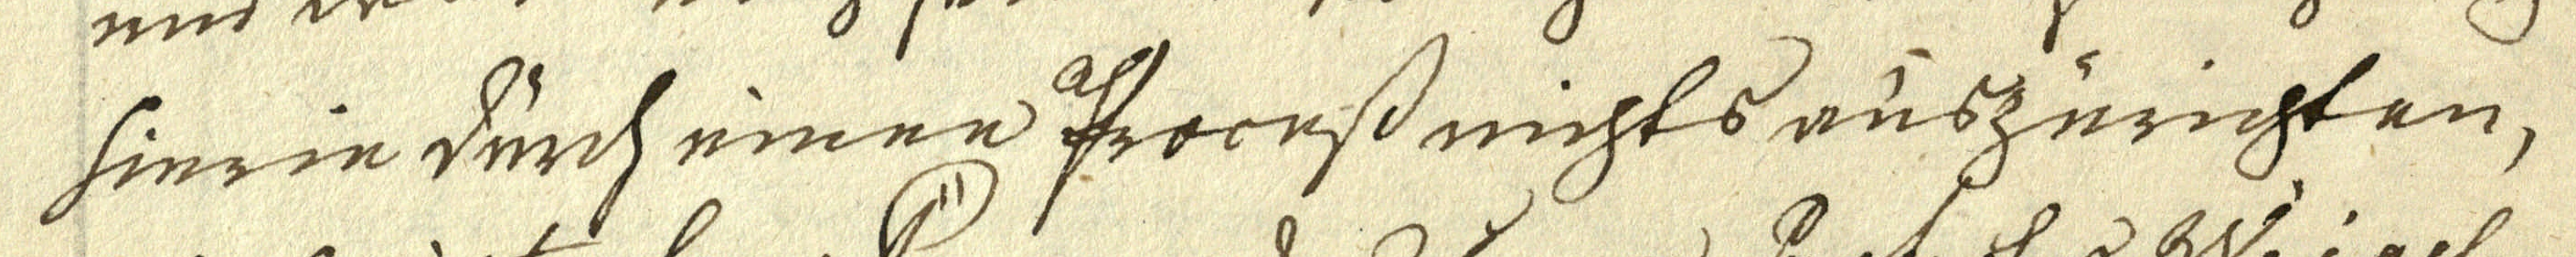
hierin durch einen Proceß nichts auszurichten,
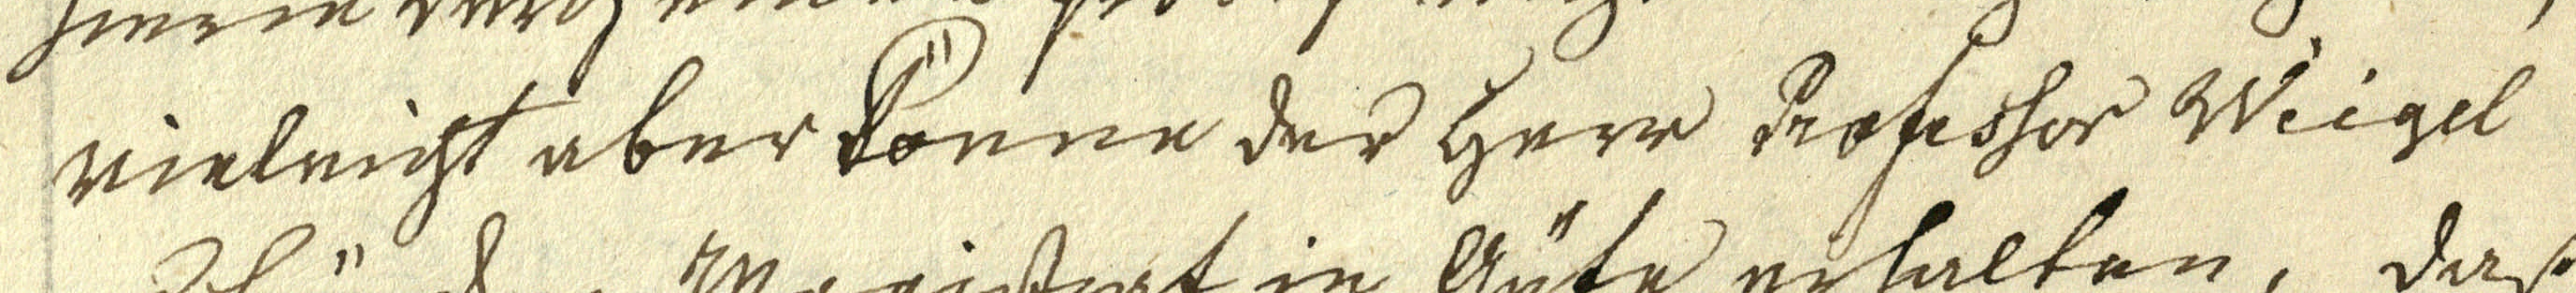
vieleicht aber könne der Herr Professor Weigel
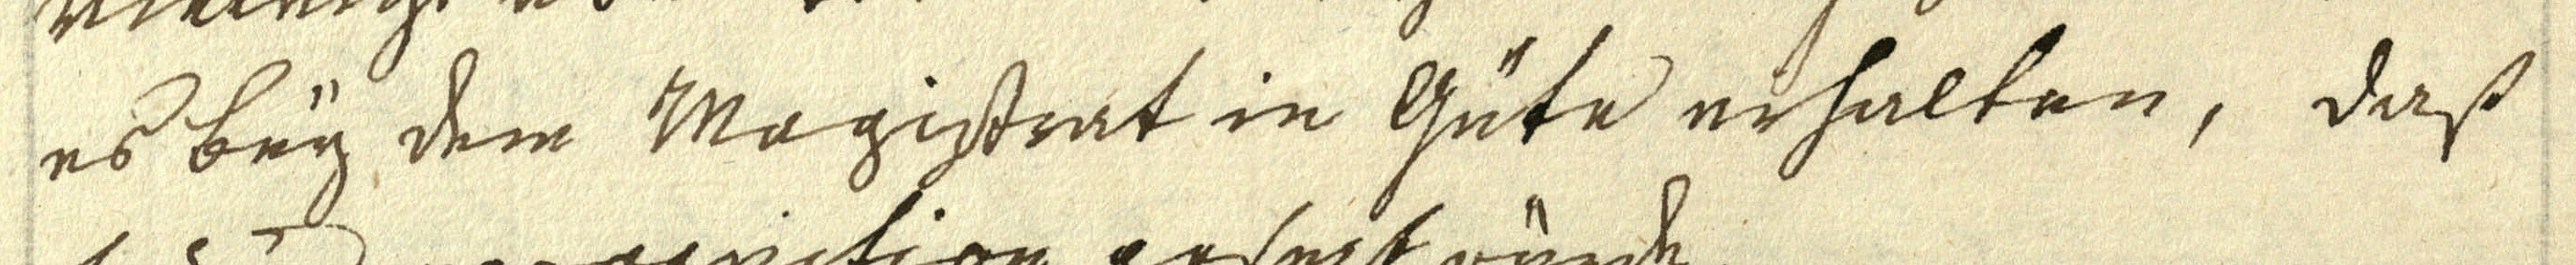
es beÿ dem Magistrat in Güte erhalten, daß
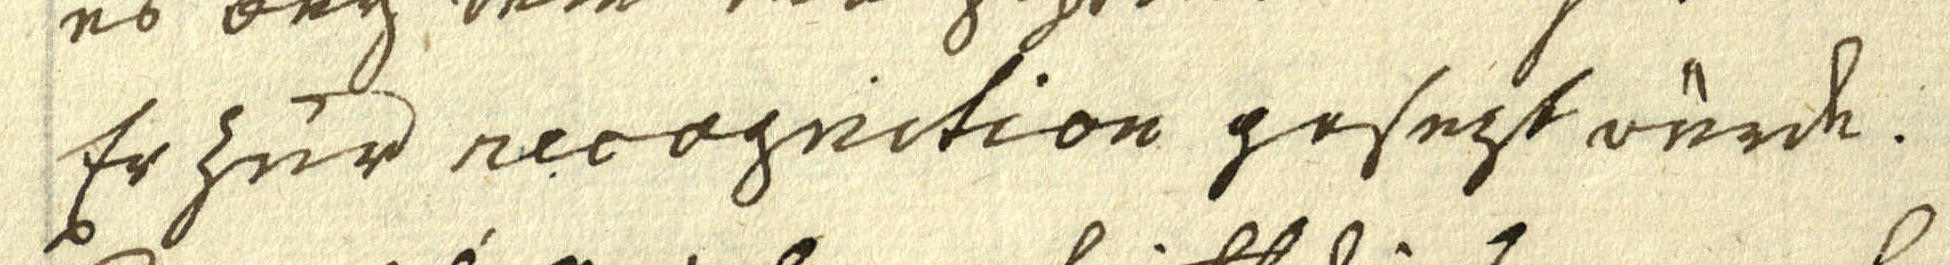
Er zur recognition gesezt würde.
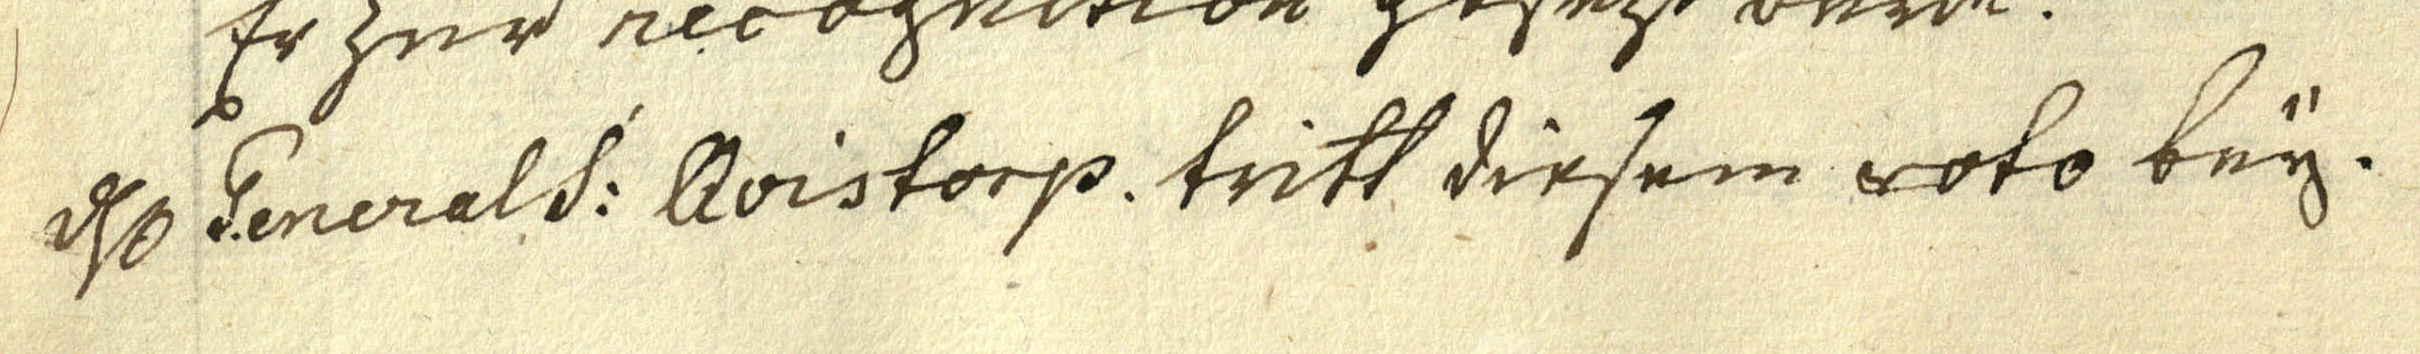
dh GeneralS. Quistorp tritt diesem voto beÿ.
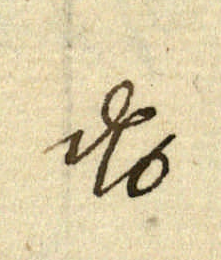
dh
